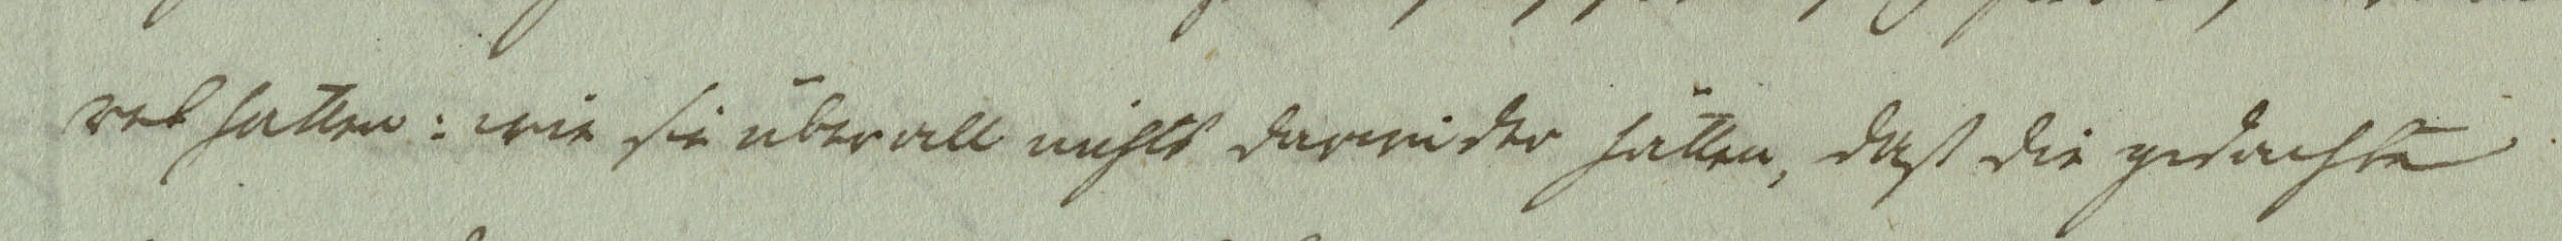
ret hatten: wie sie überall nichts darwider hätten, daß die gedachte
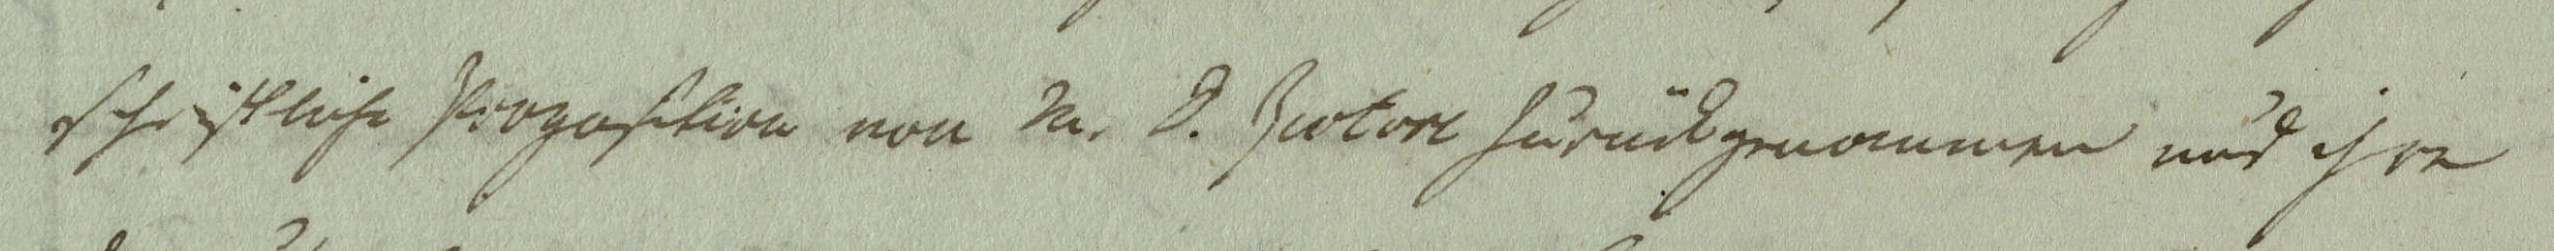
schriftliche Proposition von M. D. Rectore zurückgenommen und ihre
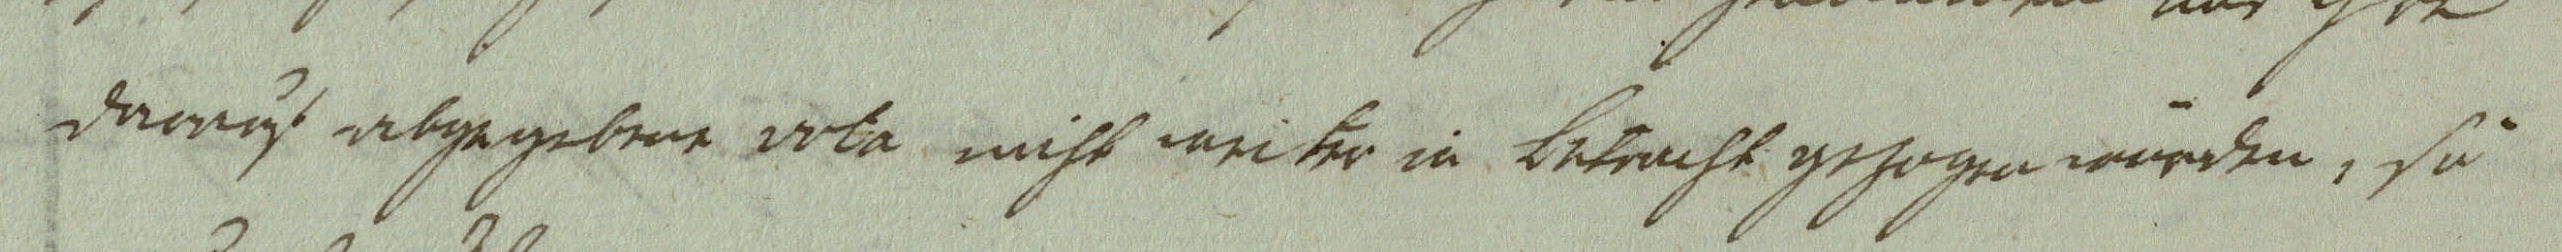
darauf abgegebene vota nicht weiter in Betracht gezogen würden, so
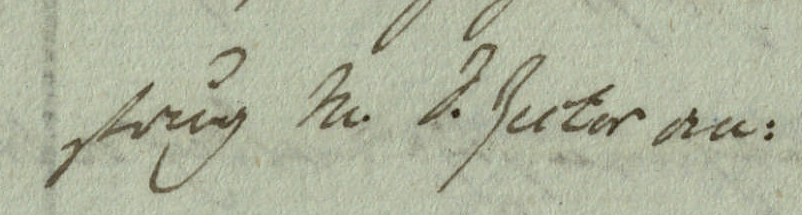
frug M. D. Rector an:
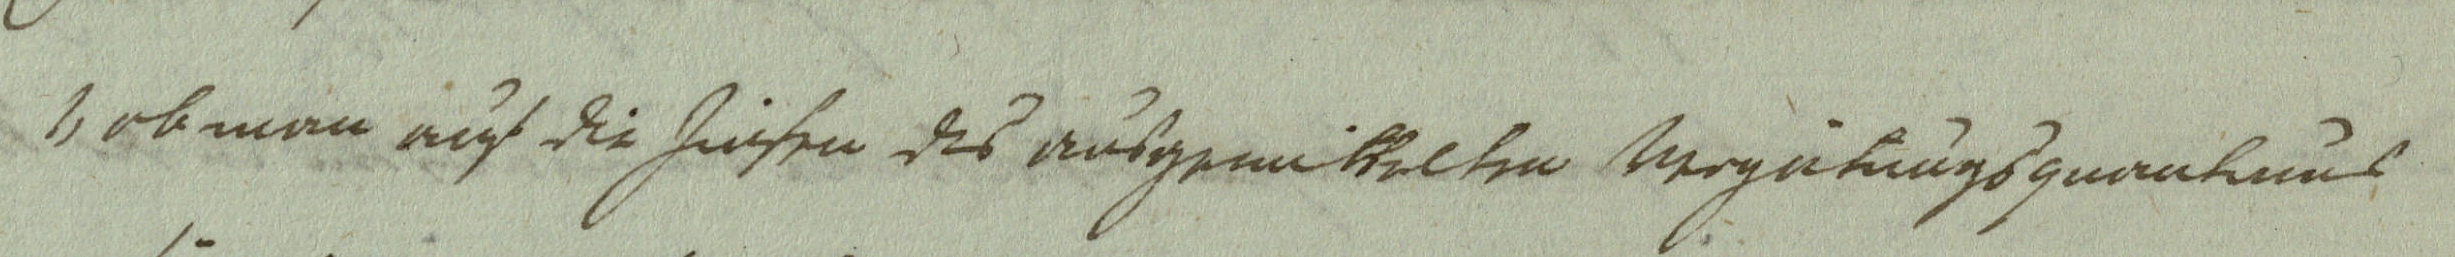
1, ob man auf die Zinsen des ausgemittelten Vergütungsquantums
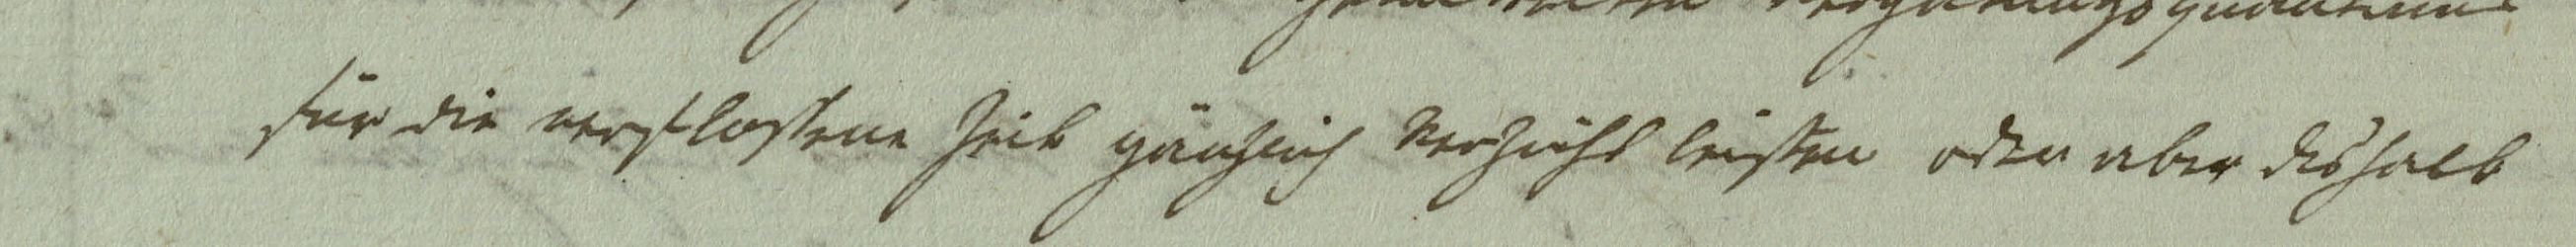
für die verflossene Zeit gänzlich Verzicht leisten oder aber deshalb
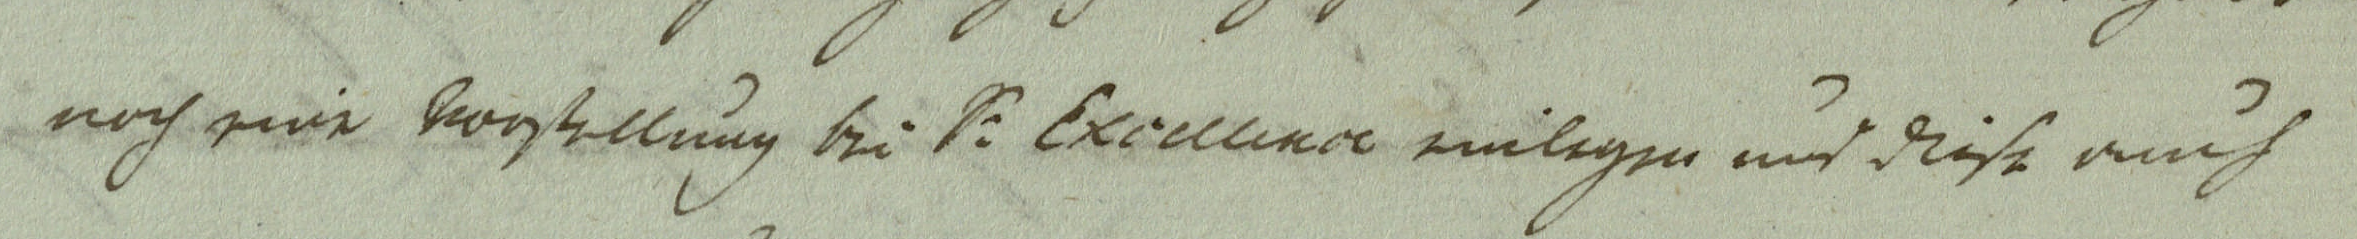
noch eine Vorstellung bei Sr. Excellence einlegen und diese auch
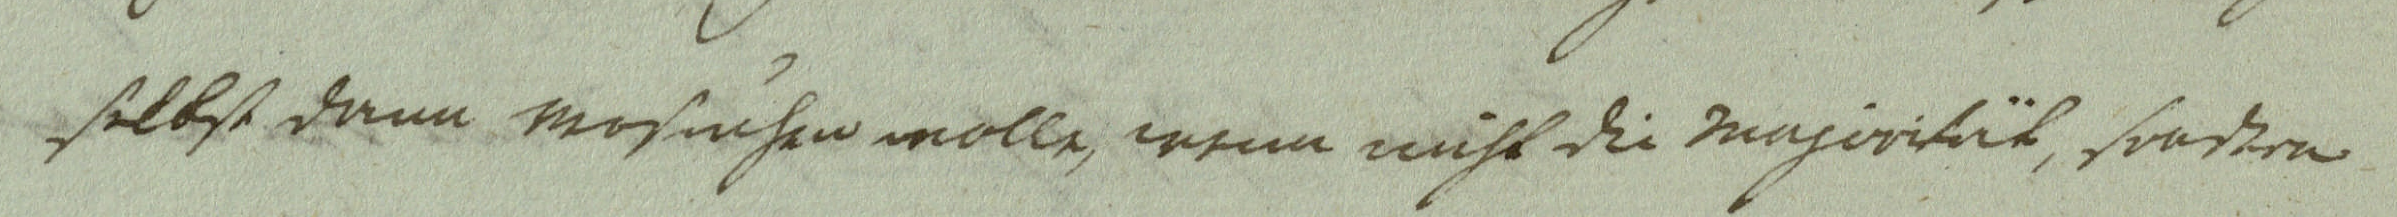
selbst dann versuchen wolle, wenn nicht die Majorität, sondern
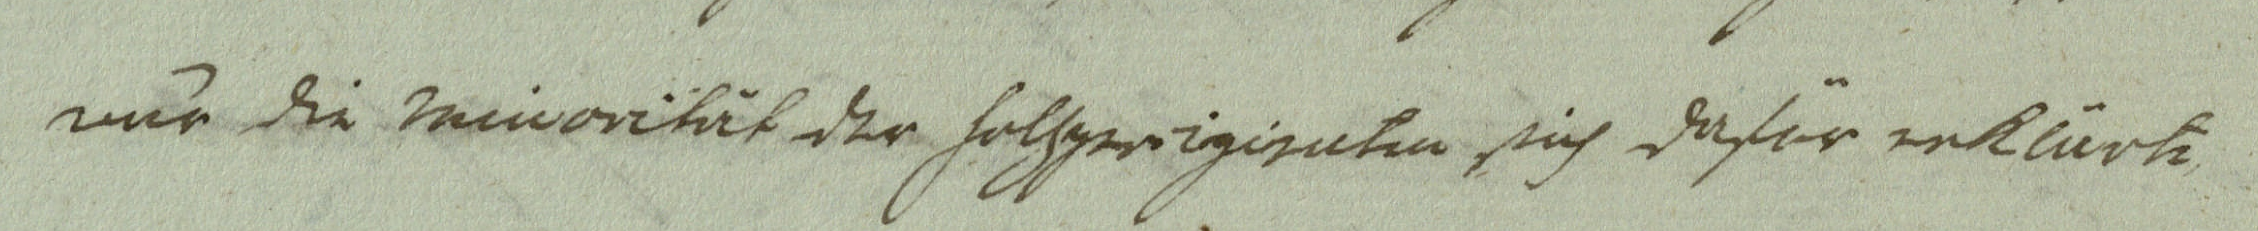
nur die Minorität der Holzpercipienten sich dafür erklärte,
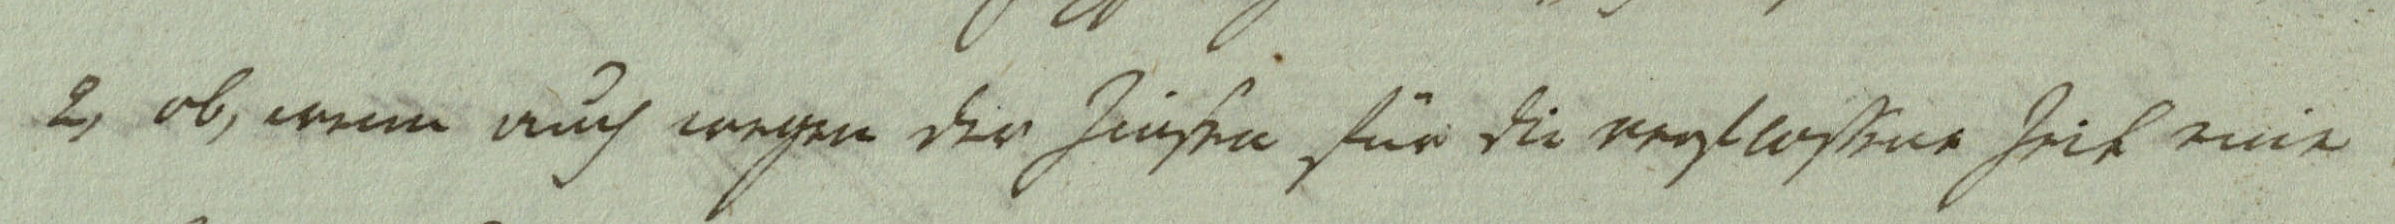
2, ob, wenn auch wegen der Zinsen für die verflossene Zeit eine
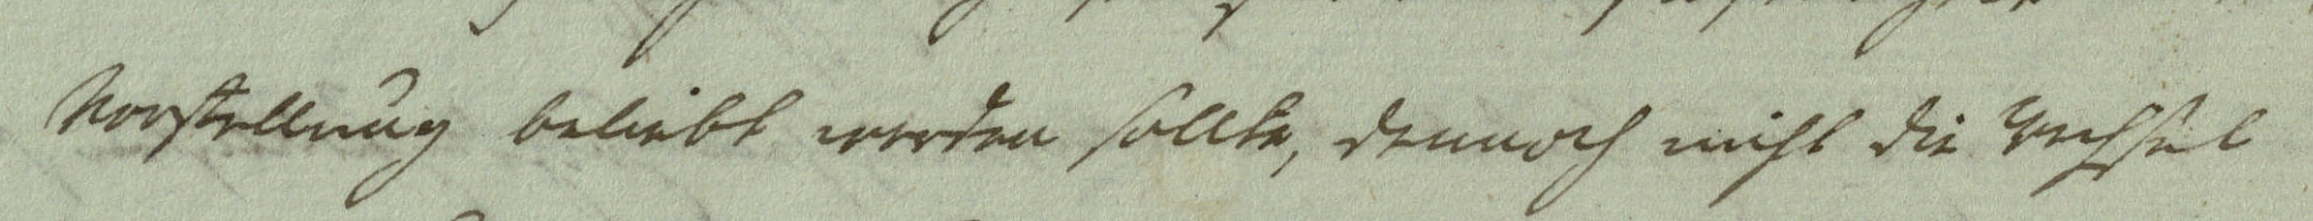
Vorstellung beliebt werden sollte, dennoch nicht die Wechsel
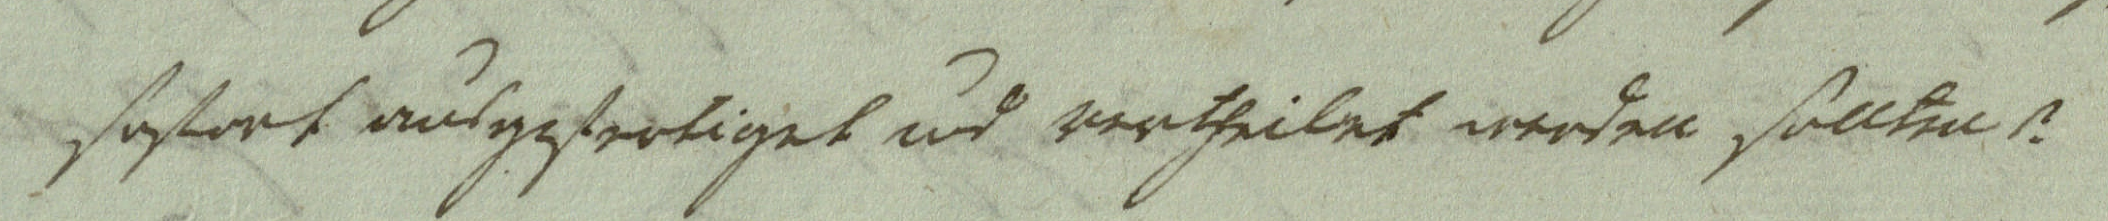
sofort ausgefertiget und vertheilet werden sollten?
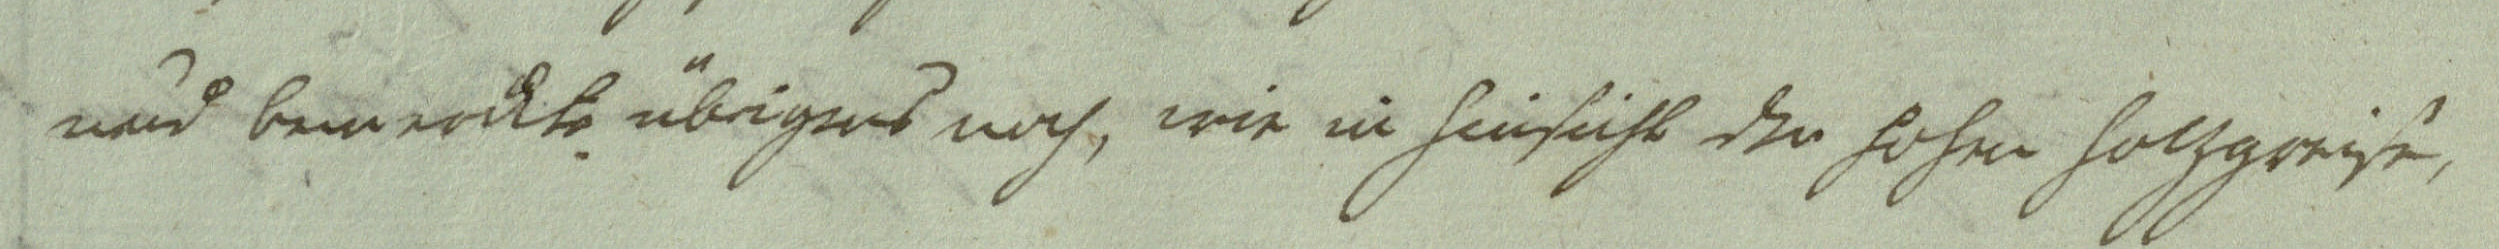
und bemerckte übrigens noch, wie in hinsicht der hohen holzpreise,
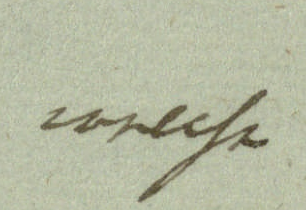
welche
